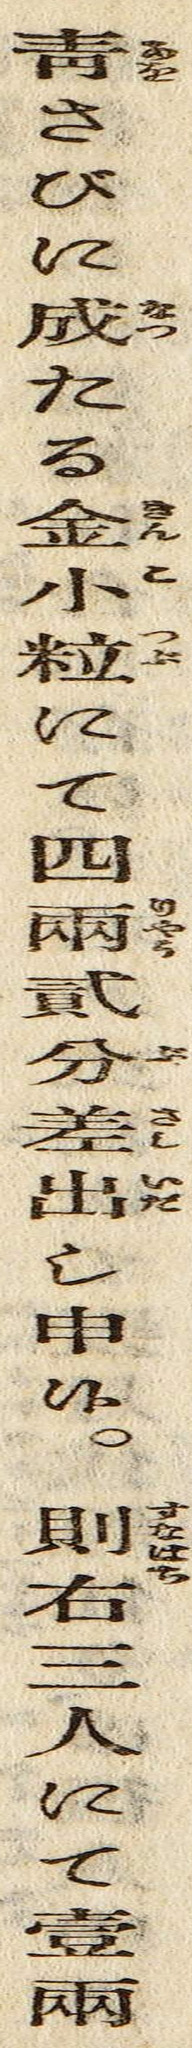青さびに成たる金小粒にて四両弐分差出し申候。則右三人にて壱両
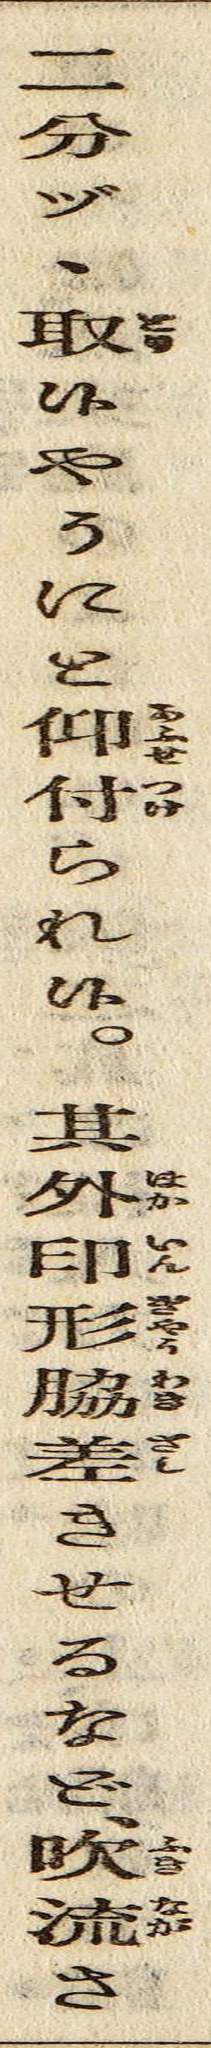二分ヅヽ取候やうにと仰付られ候。其外印形脇差きせるなど、吹流さ
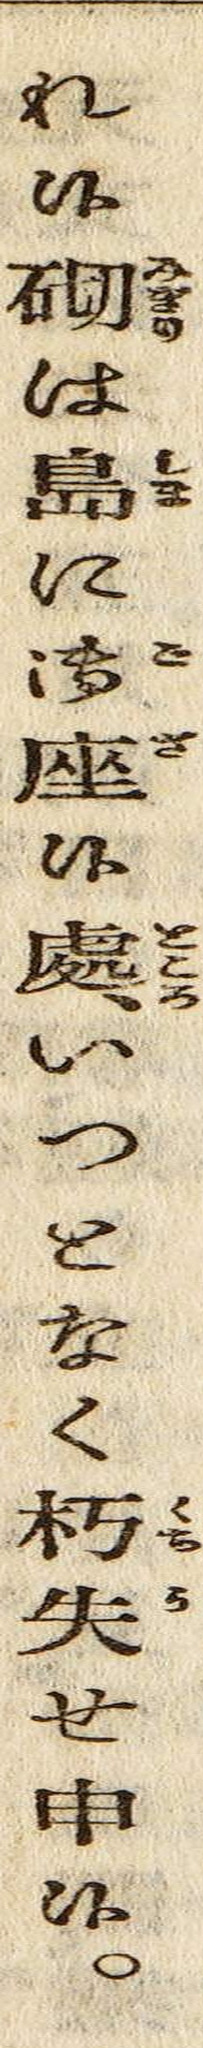れ候砌は島に御座候処、いつとなく朽失せ申候。
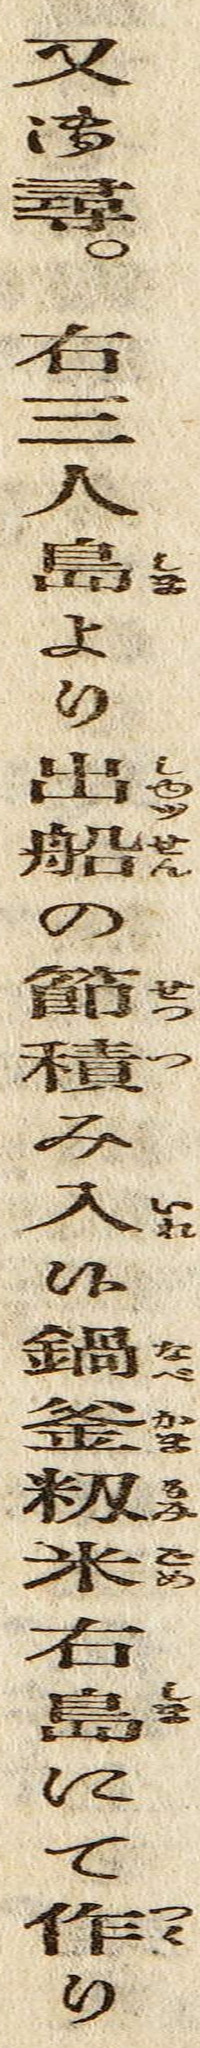又御尋。右三人島より出船の節積み入候鍋釜籾米右島にて作り
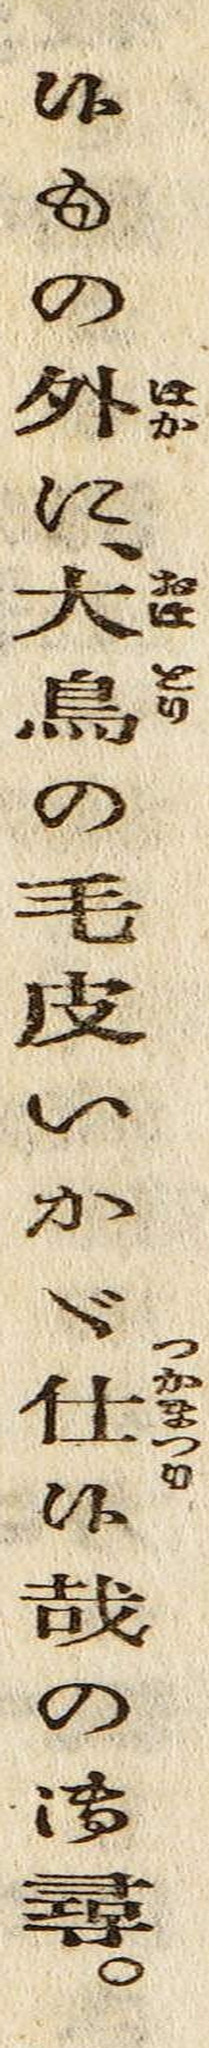候もの外に、大鳥の毛皮いかヾ仕候哉の御尋。
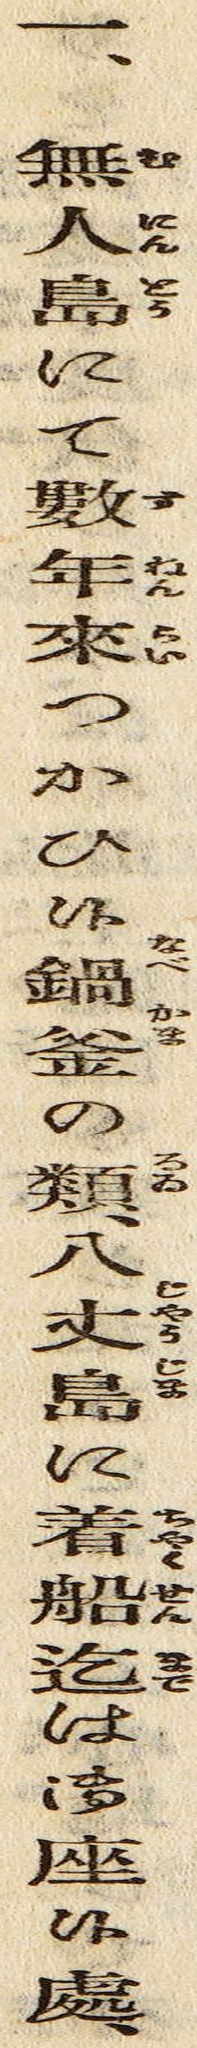一、無人島にて数年来つかひ候鍋釜の類、八丈島に着船迄は御座候処、
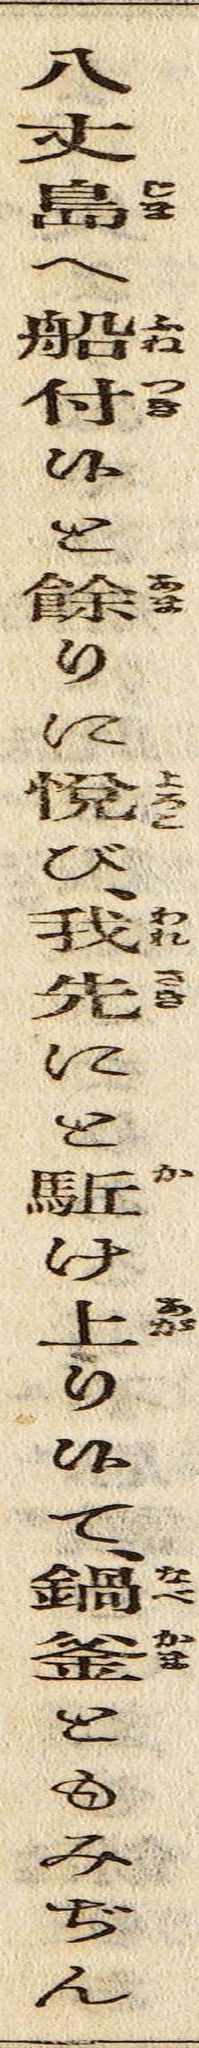八丈島へ船付候と余りに悦び、我先にと駈け上り候て、鍋釜ともみぢん
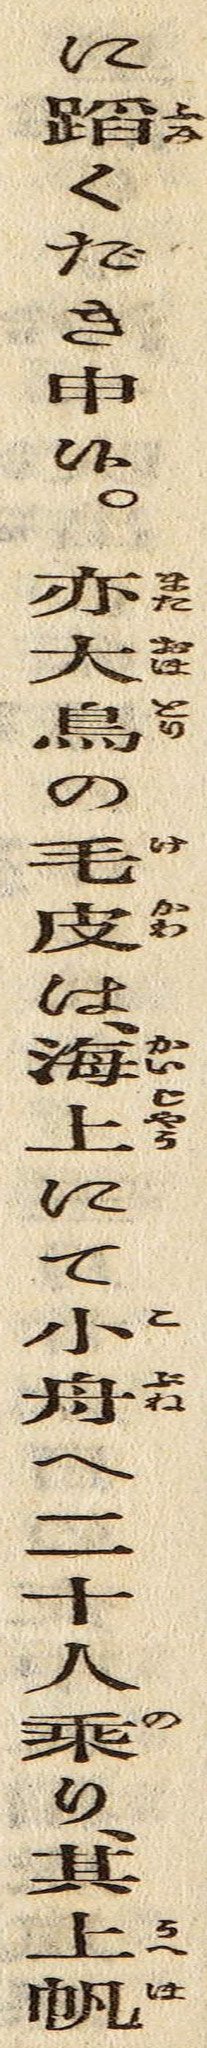に蹈くだき申候。亦大鳥の毛皮は、海上にて小舟へ二十人乗り、其上帆
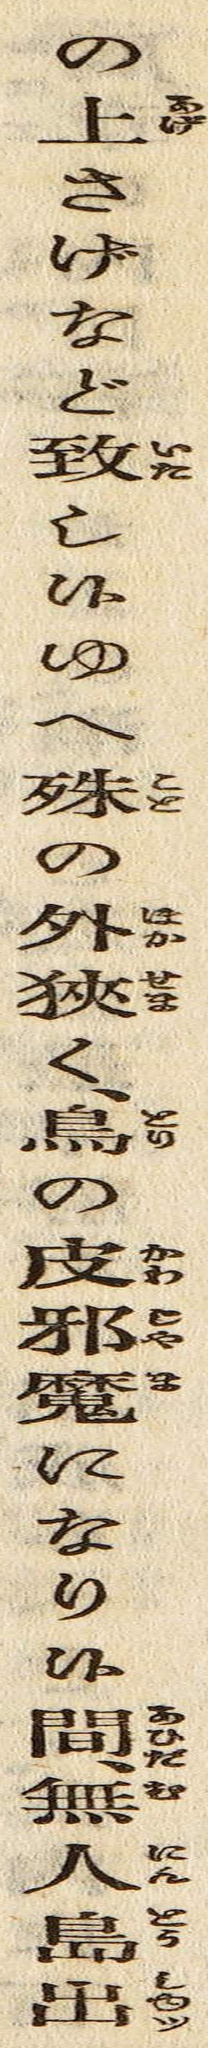の上さげなど致し候ゆへ殊の外狭く、鳥の皮邪魔になり候間、無人島出
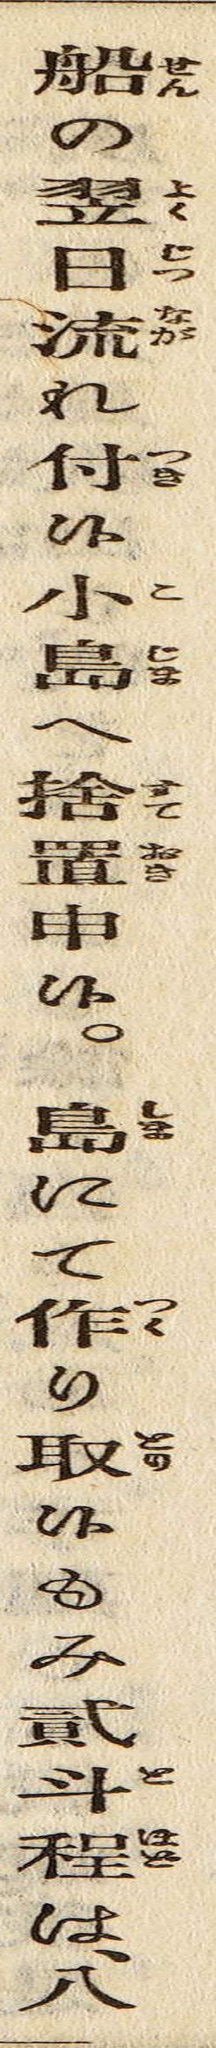船の翌日流れ付候小島へ捨置申候。島にて作り取候もみ弐斗程は、八
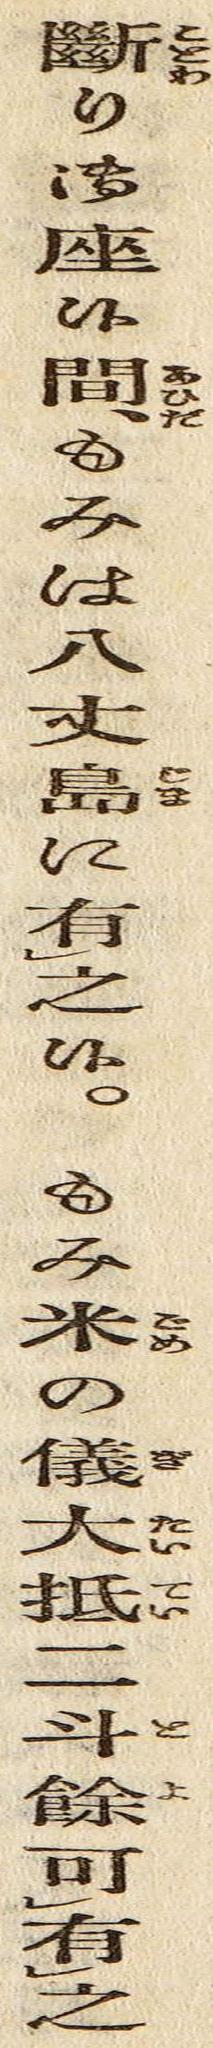断り御座候間、もみは八丈島に有之候。もみ米の儀大抵二斗余可有之
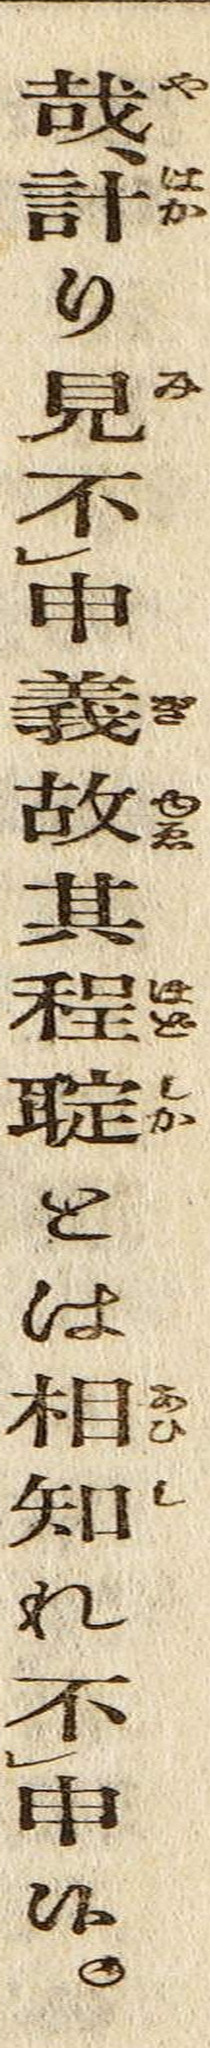哉、計り見不申義故其程聢とは相知れ不申候。

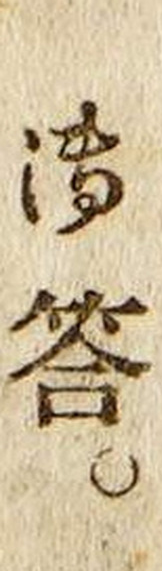御答。
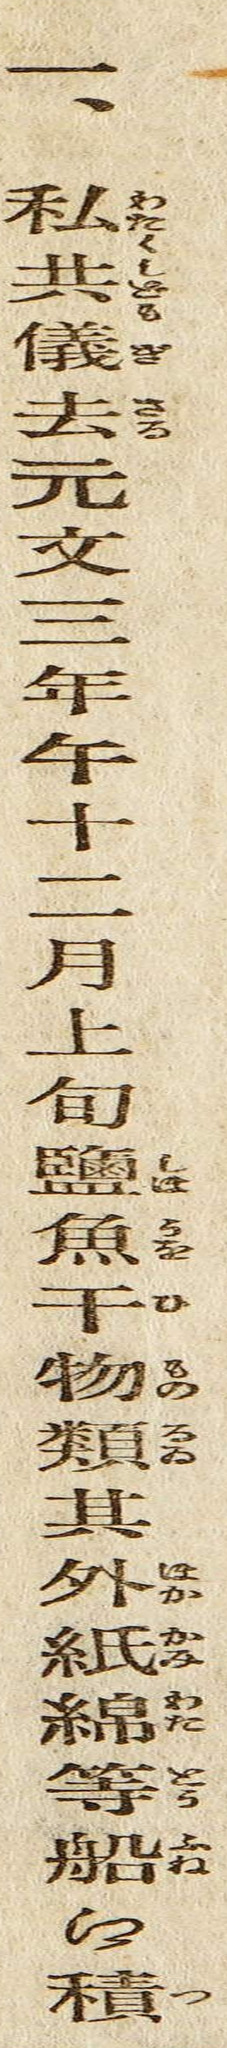一、私共儀去元文三年午十二月上旬塩魚干物類其外紙綿等船え積
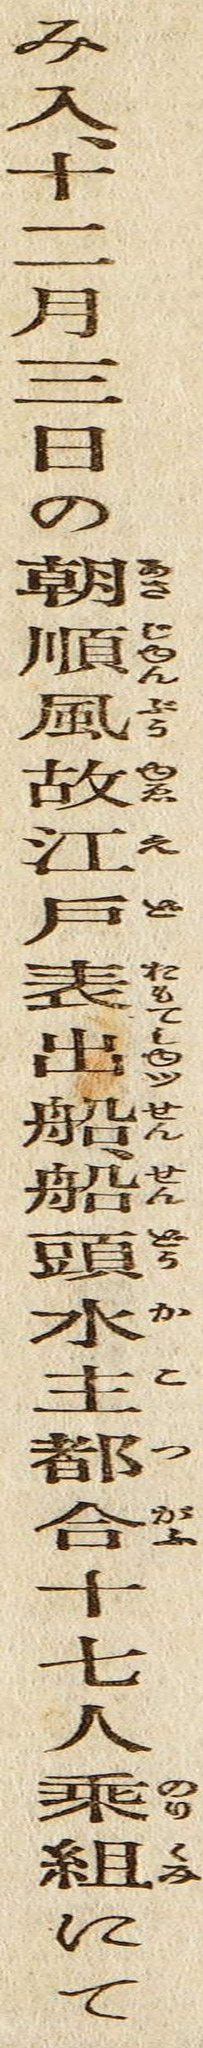み入、十二月三日の朝順風故江戸表出船、船頭水主都合十七人乗組にて
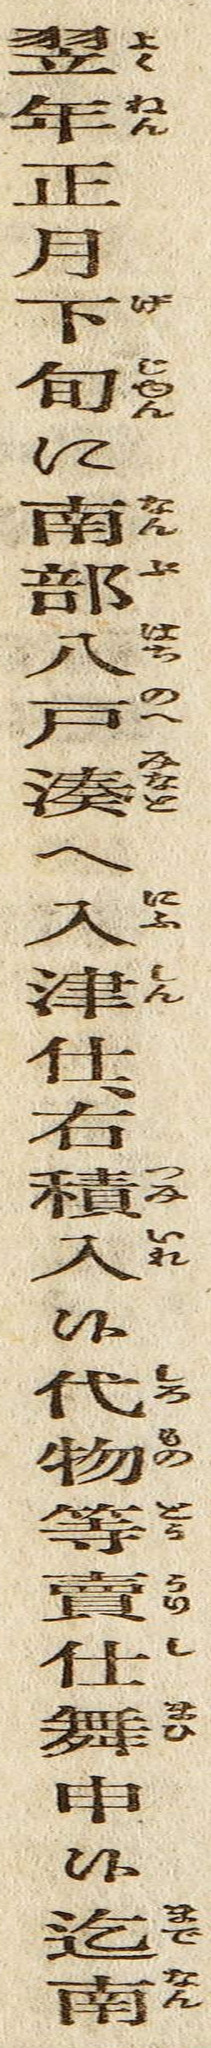翌年正月下旬に南部八戸湊へ入津仕、右積入候代物等売仕舞申候迄南
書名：日本漂流譚
